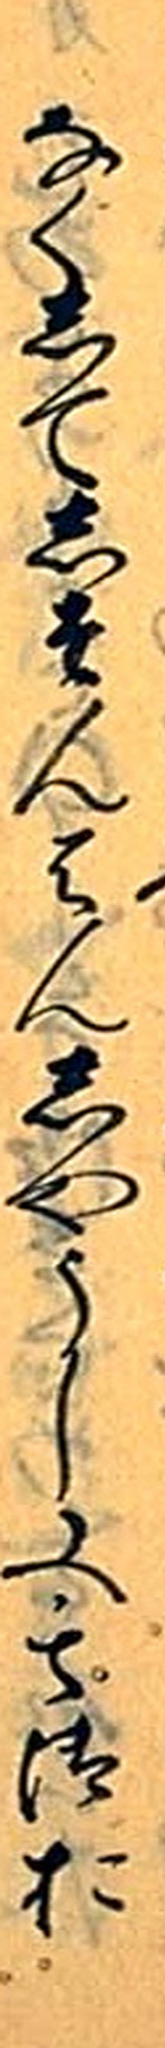なくしてしそんはんしやうし又其御お
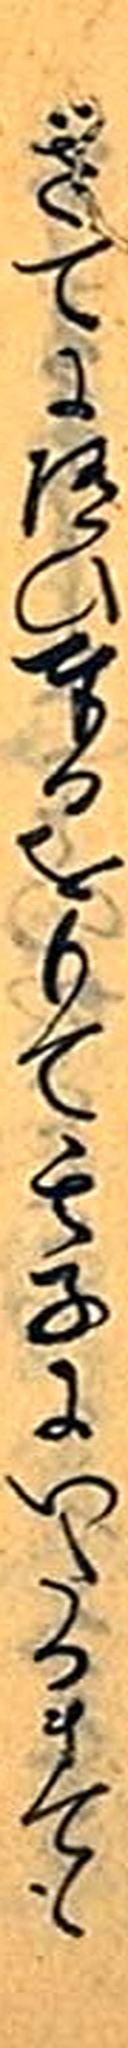きてに随ひ奉るをもて其子にいたるまても
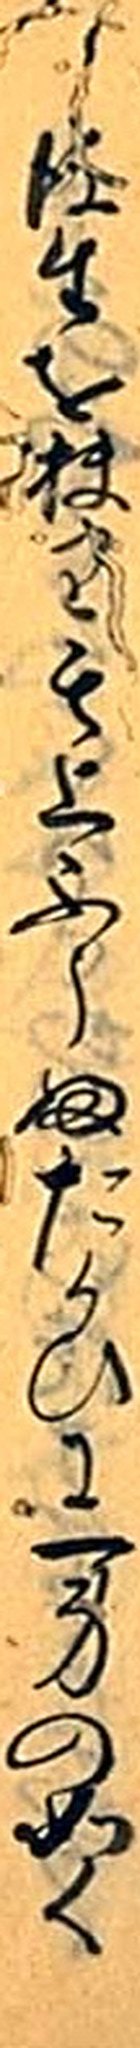後生を扶り其上ふう婦たかひに一身の如く
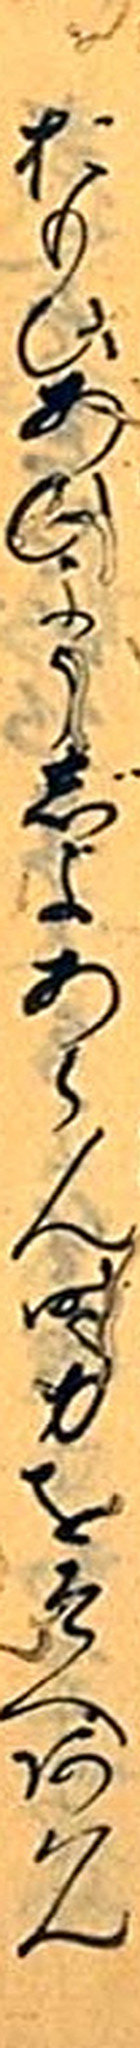おもひあひにうじよあらん時力をそへあはん
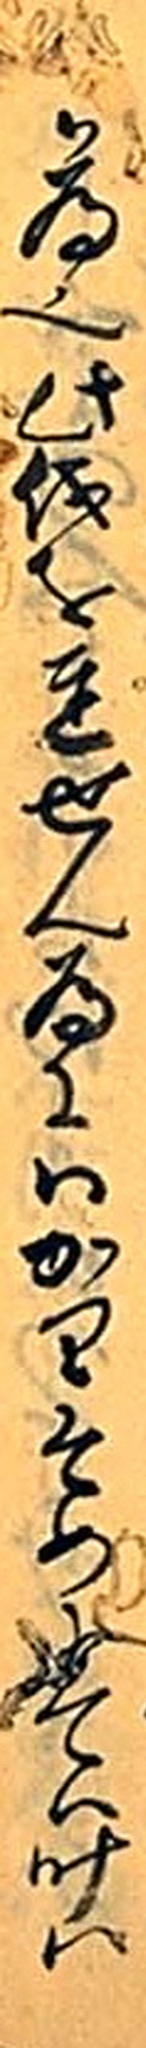か為也此儀を達せん為にはかりそめにては叶は
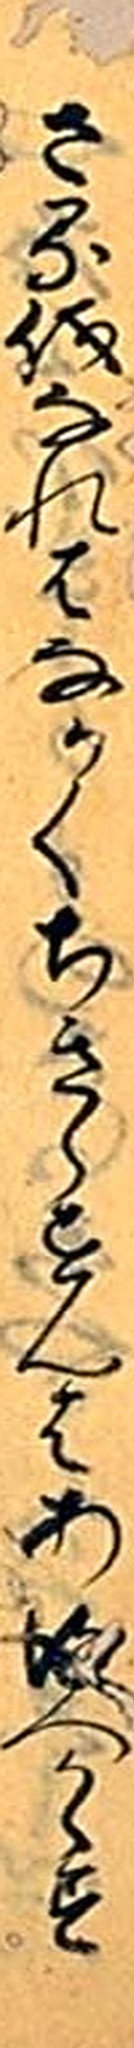さる儀なれはなかくちきらすんはあへからす
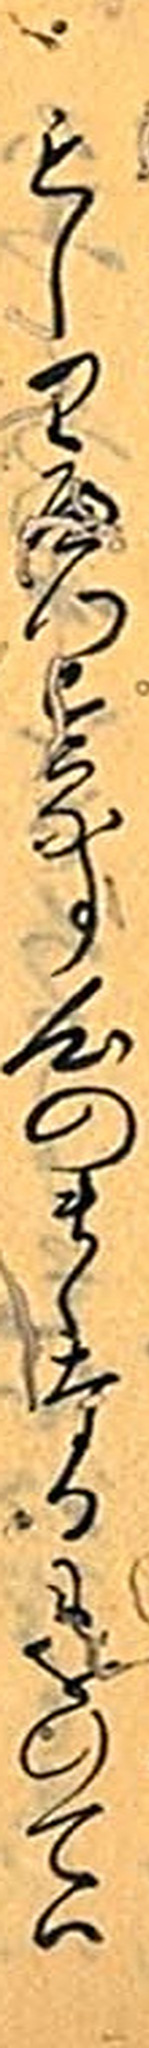もしりへつする事心のまゝなるにをひては
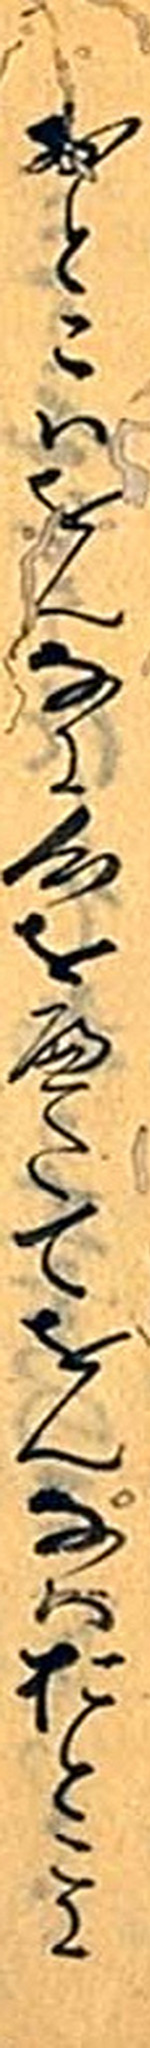おとこはをんなに心をへたてをんなはおとこに
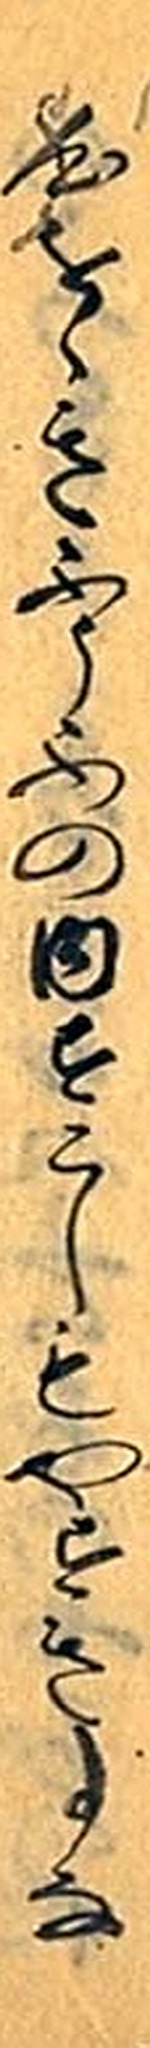心をゝきふうふの内すこしもやすき事な
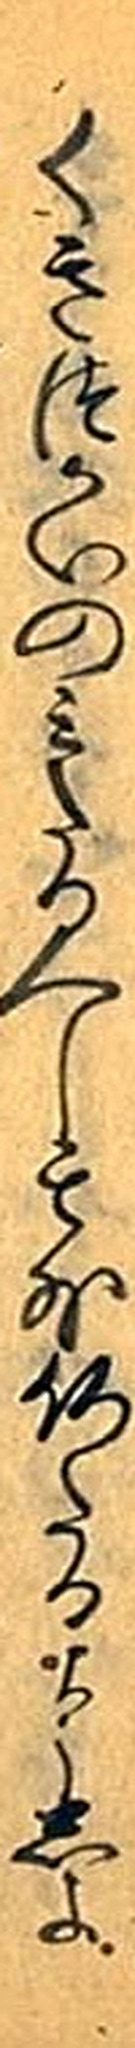くきつかひのみたるへし其外何たるようしよ
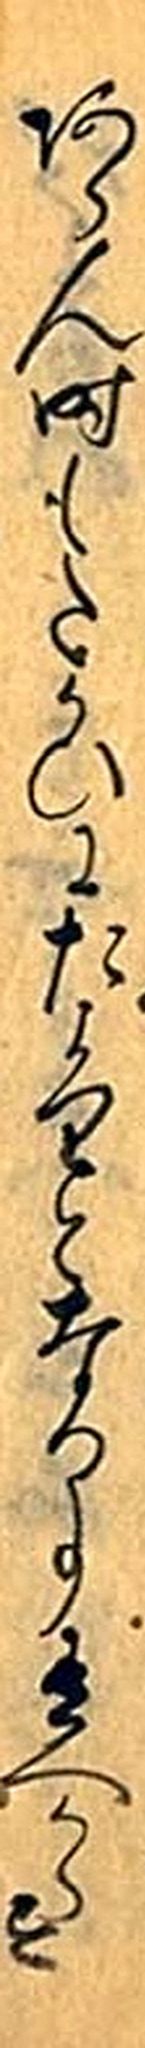あらん時もたかひにたよりとなる事有へからす
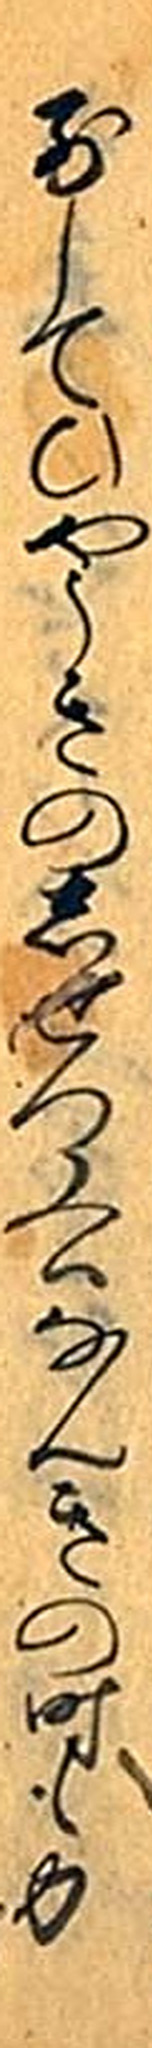別してひやうきのしせつ又はなんきの時も力
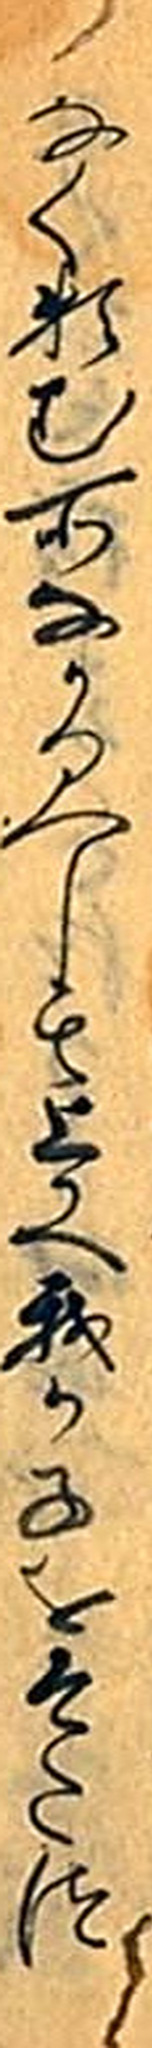なく頼む所なかるへし其上又我か子をそたつ
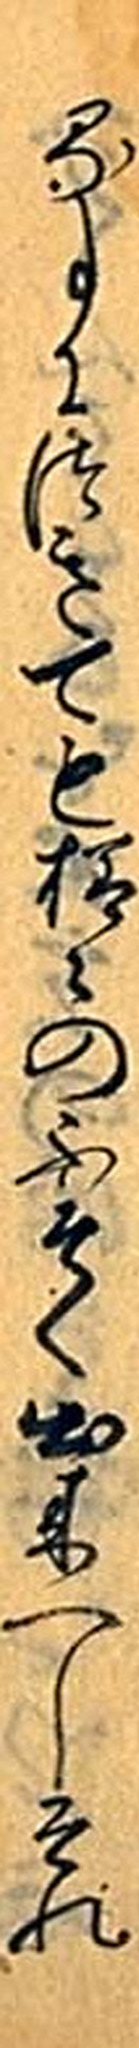る事につきても様々のふそく出来へしそれ
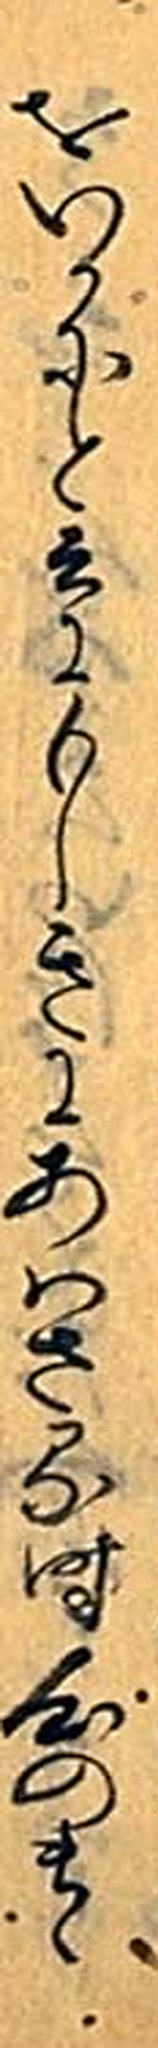をいかにと云にもしきにあはさる時心のまゝ
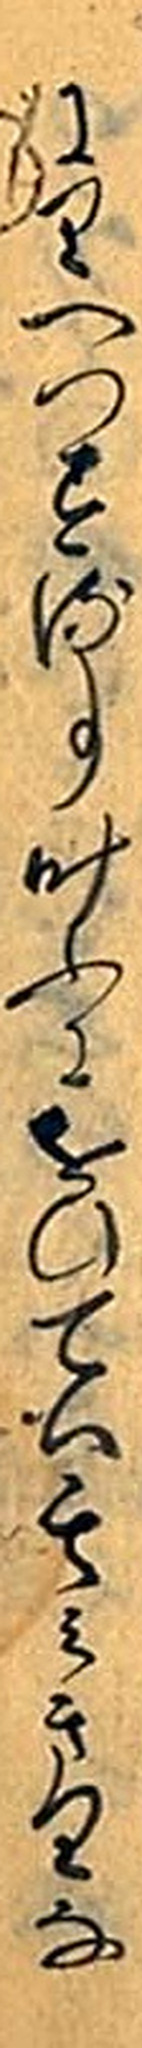にりへつする事叶ふにをひては其みきりな
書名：ドチリナ・キリシタン
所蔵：東京大学総合図書館 / General Library in the University of Tokyo
